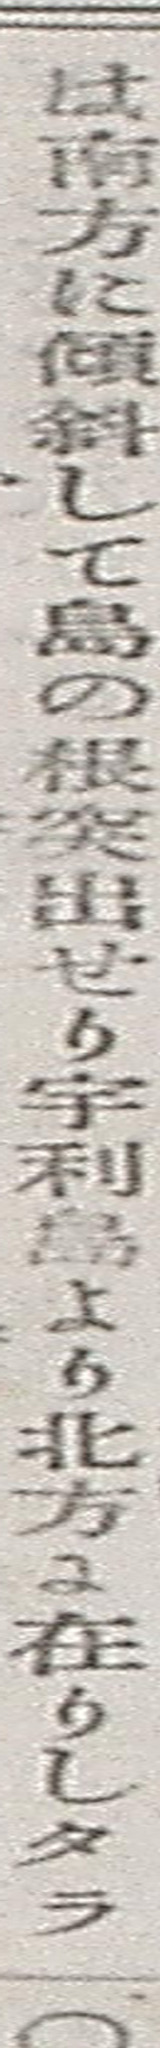は南方に傾斜して島の根突出せり宇利島より北方に在りしタラ
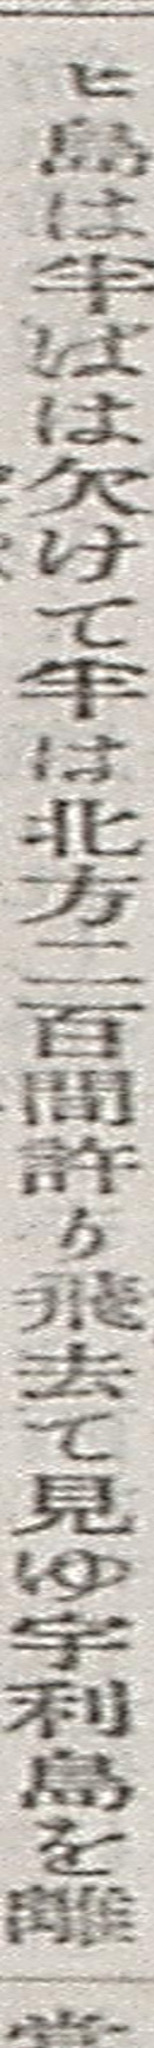ヒ島は半ばは欠けて半は北方ニ百間許り飛去て見ゆ宇利島を離
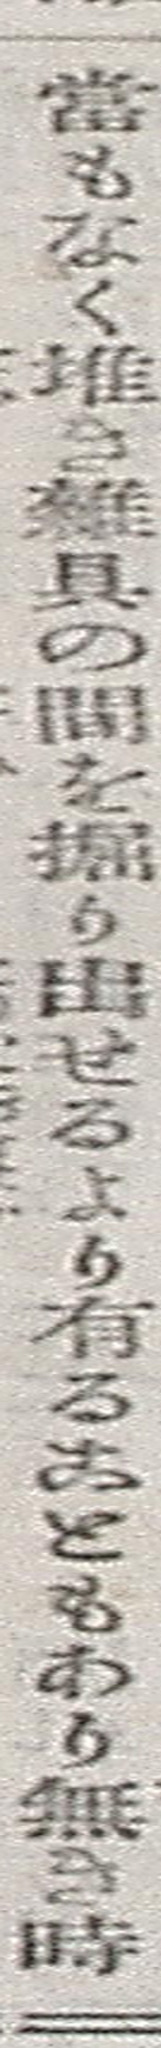当もなく堆き雑具の間を掘り出せるより有ることもあり無き時
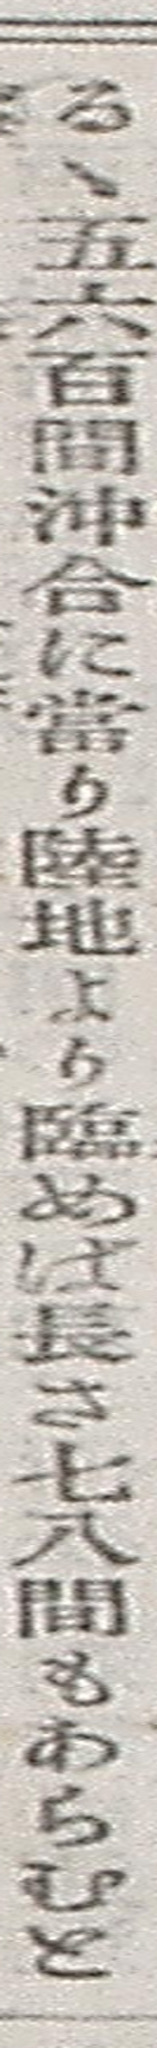るゝ五六百間沖合に当り陸地より臨めば長さ七八間もあらむと
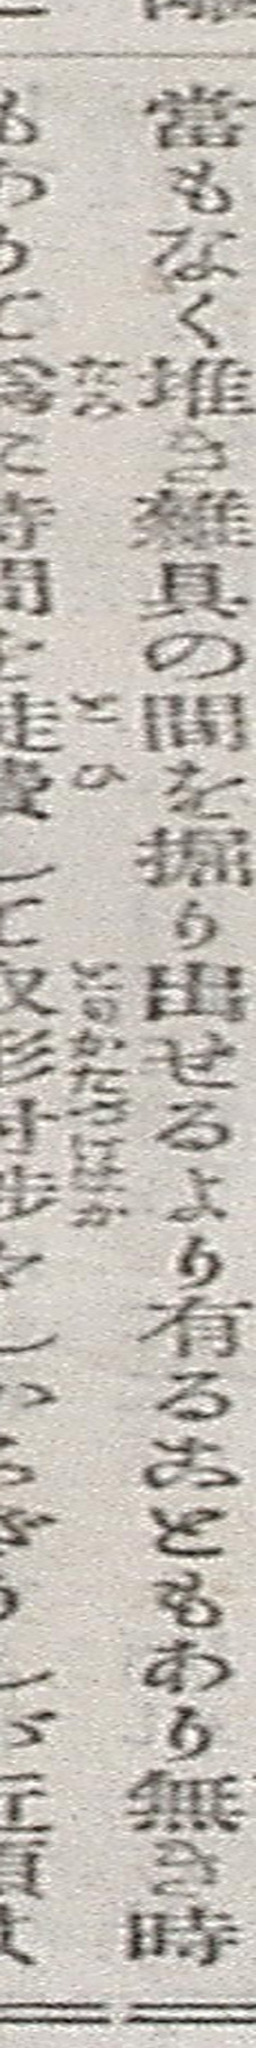もありて為に時間を徒費して取形付捗々しからざりしが近頃は
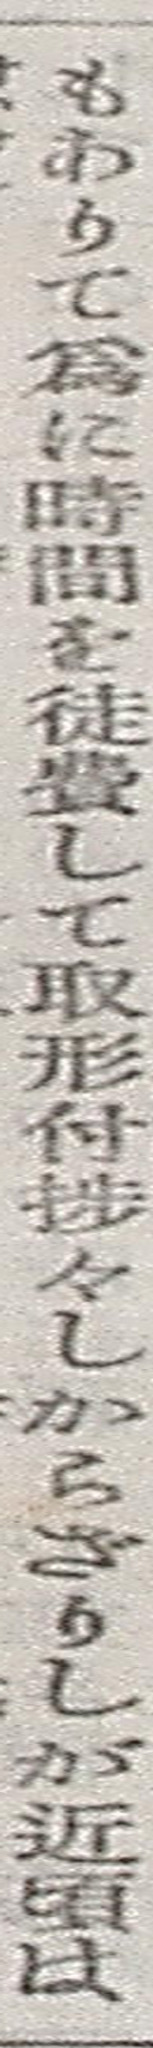もありて為に時間を徒費して取形付捗々しからざりしが近頃は
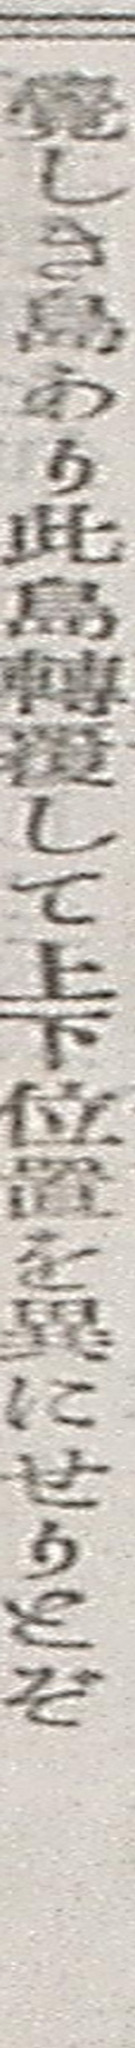覚しき島あり此島転覆して上下位置を異にせりとぞ
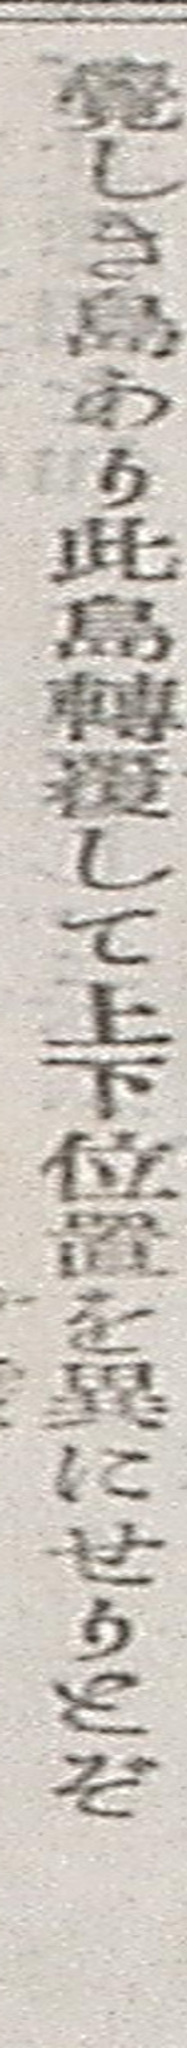覚しき島あり此島転覆して上下位置を異にせりとぞ
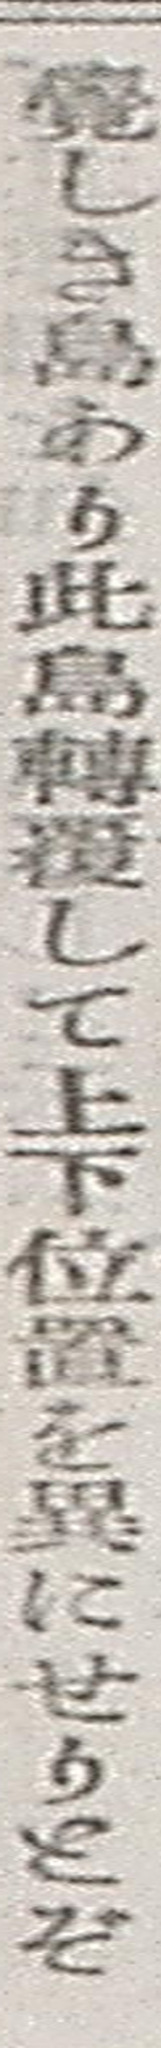覚しき島あり此島転覆して上下位置を異にせりとぞ
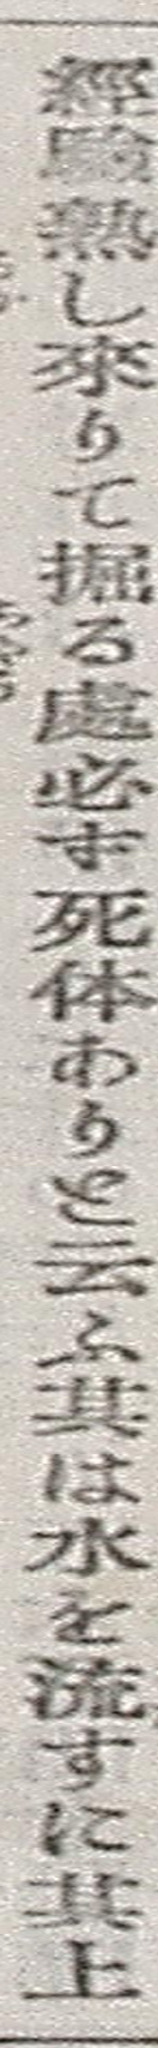経験熟し来りて掘る処必ず死体ありと云ふ其は水を流すに其上
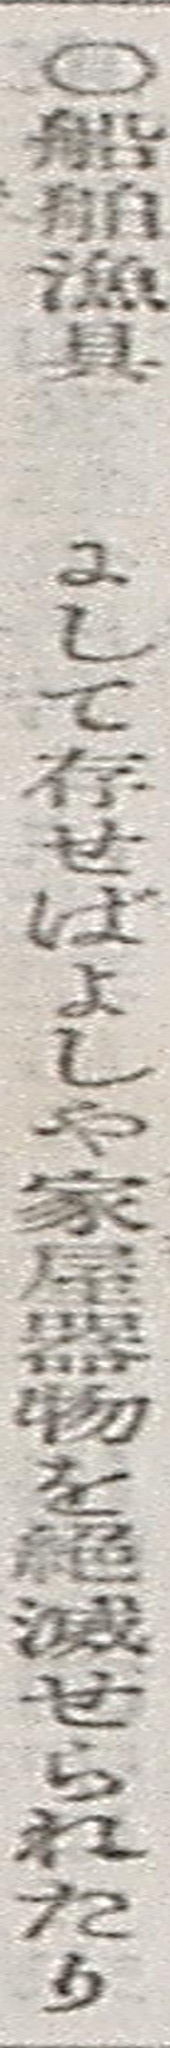○船舶漁具にして存せばよしや家屋器物を絶滅せられたり
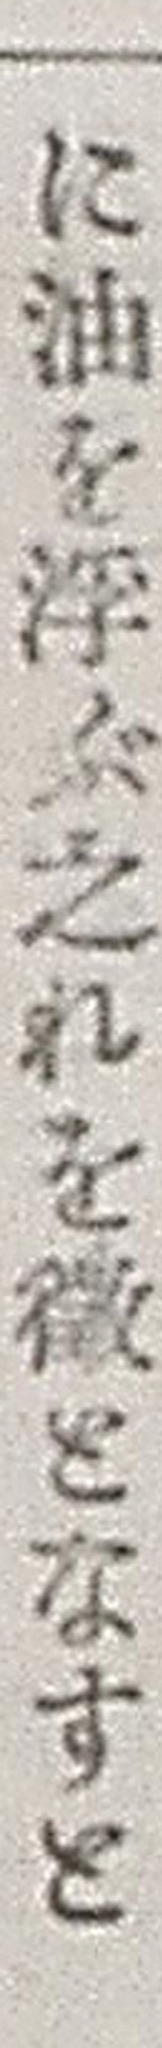に油を浮ぶ之れを徴となすと
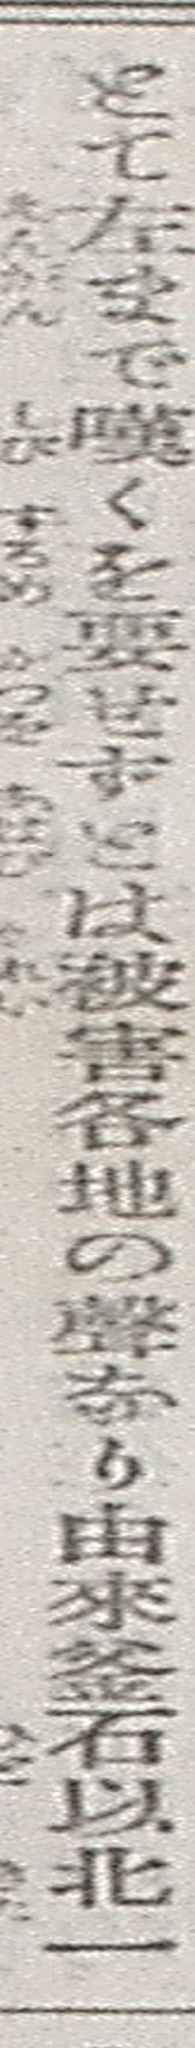とて左まで嘆くを要せずとは被害各地の声なり由来釜石以北一
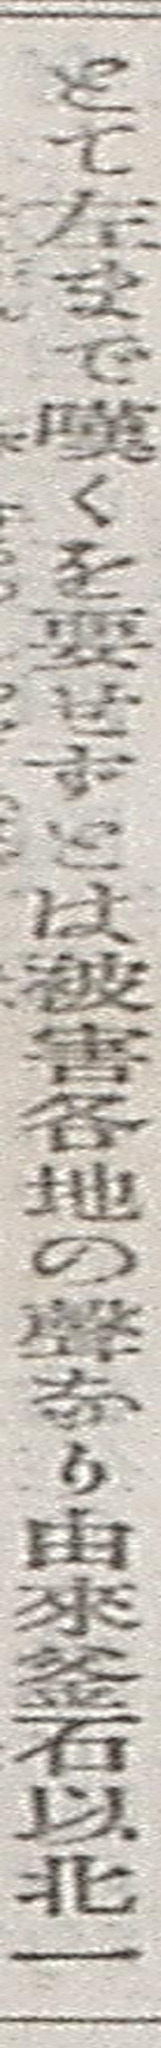とて左まで嘆くを要せずとは被害各地の声なり由来釜石以北一
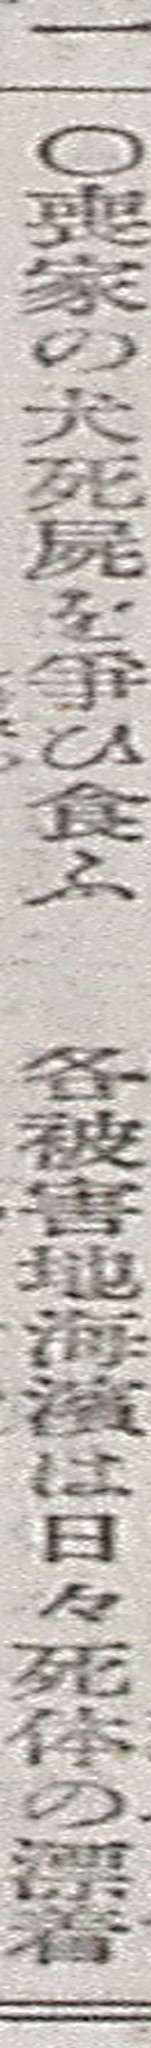○喪家の犬死屍を争ひ食ふ各被害地海浜は日々死体の漂着
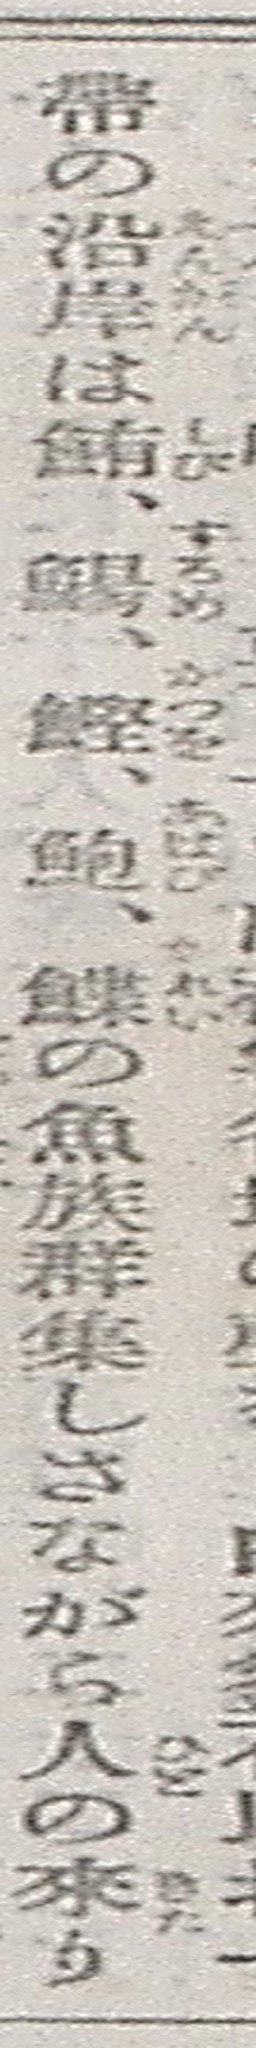帯の沿岸は鮪、鯣、鰹位、鮑、鰈の魚族群集しさながら人の来り
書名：風俗畫報臨時増刊第百二十號　大海嘯被害録（下）
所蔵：東京大学地震研究所図書室 Earthquake Research Institute Library, The University of Tokyo, JAPAN
